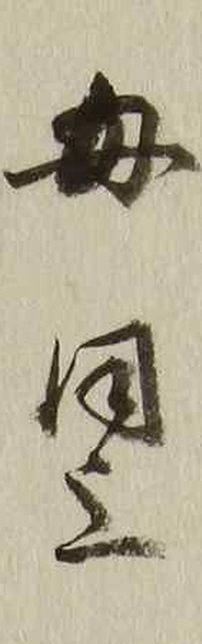母同上
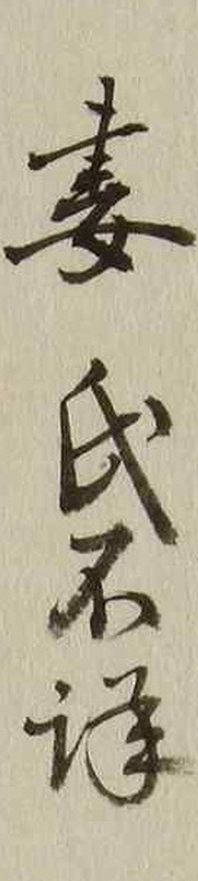妻氏不詳
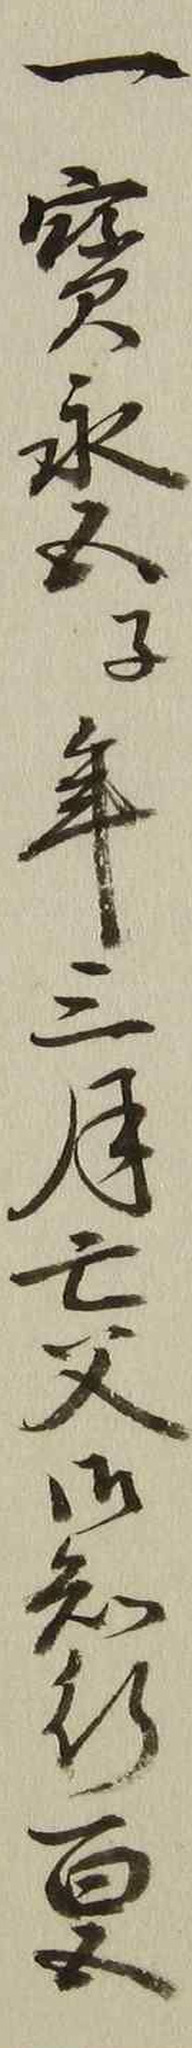一宝永五子年三月亡父御知行百五
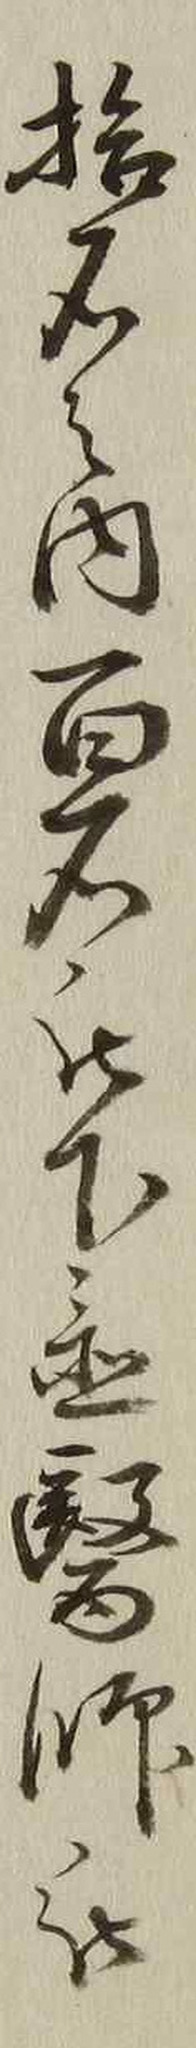拾石之内百石被下置医師被
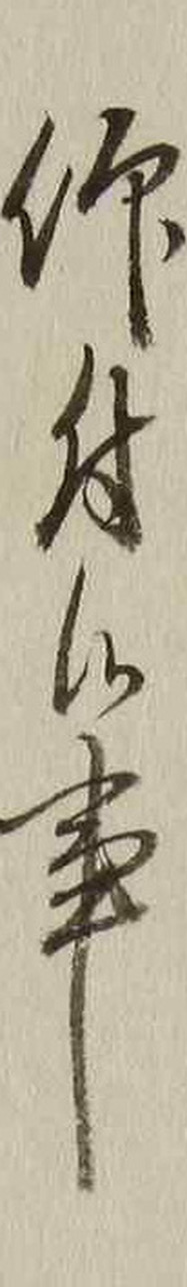仰付候事
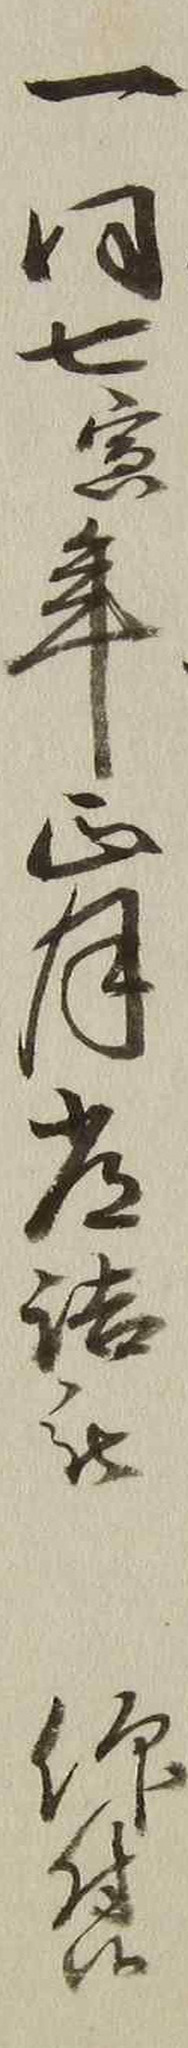一同七寅年正月常詰被仰付候
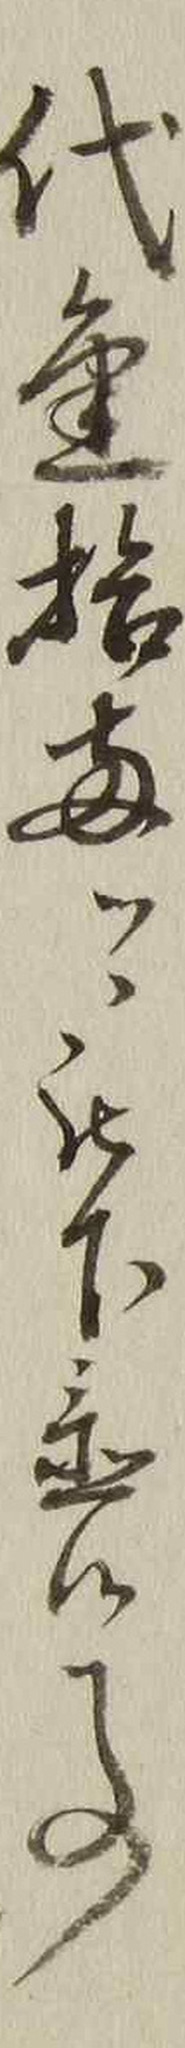代金拾両ツヽ被下置候事
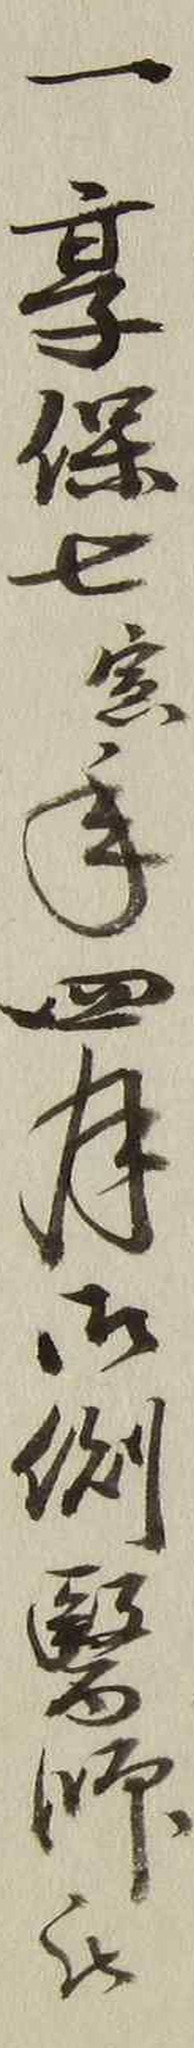一享保七寅年四月御側医師被
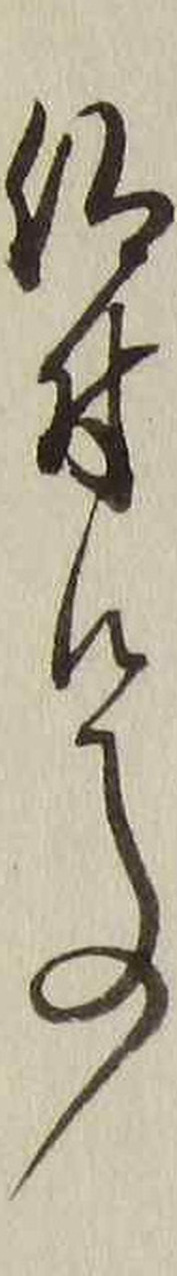仰付候事
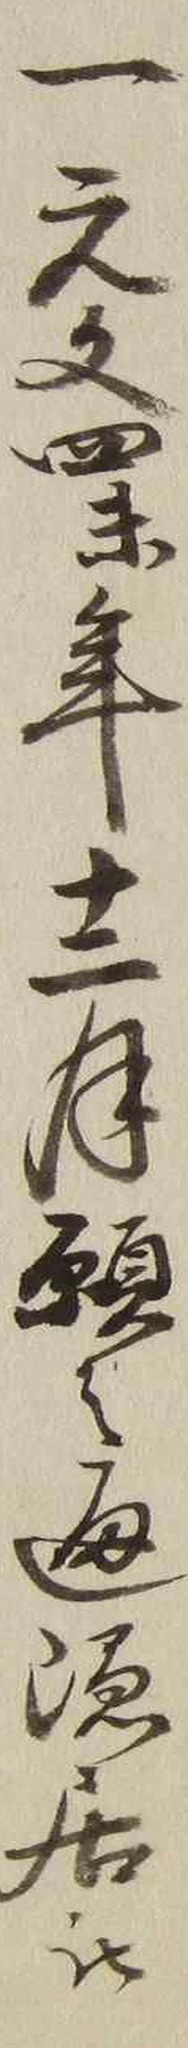一元文四未年十二月願之通隠居被
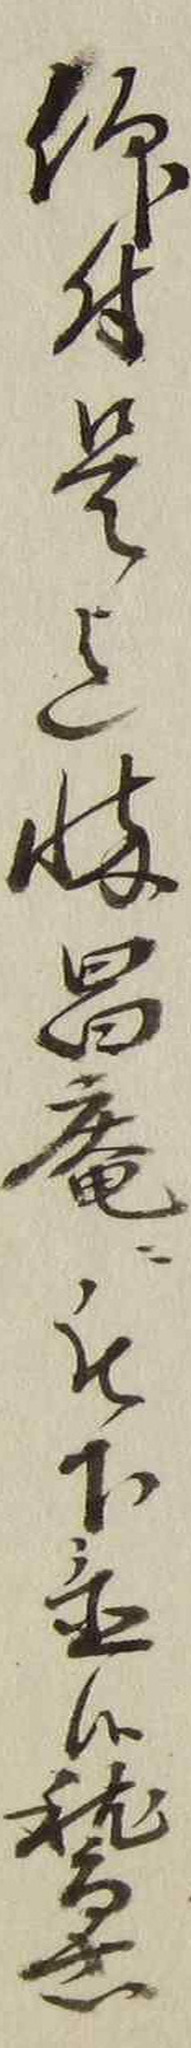仰付是迄忰昌庵ニ被下置候稽古

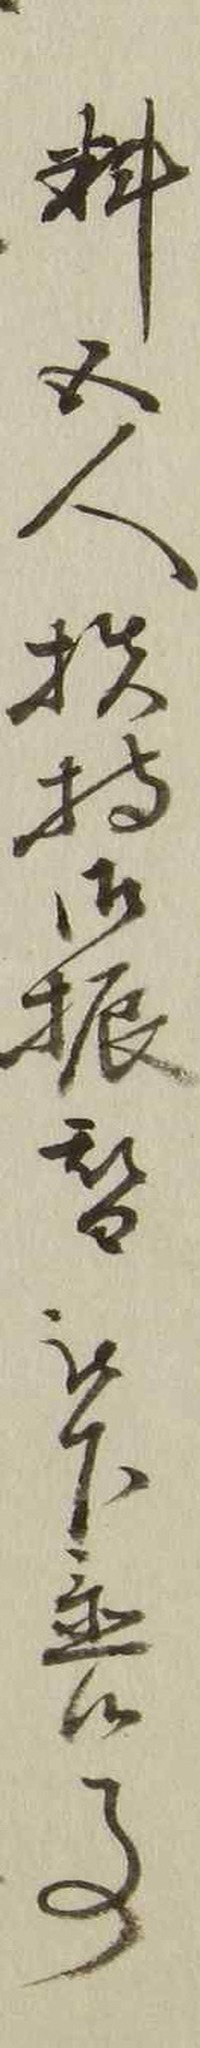料五人扶持御振替被下置候事
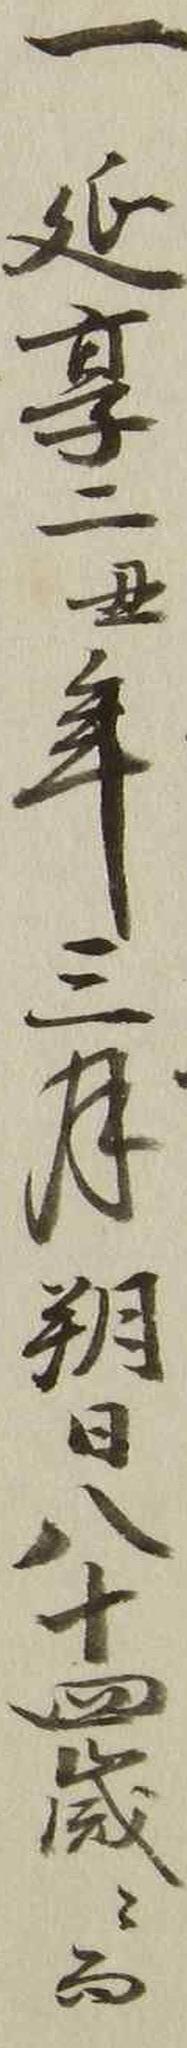一延享二丑年三月朔日八十四歳ニ而
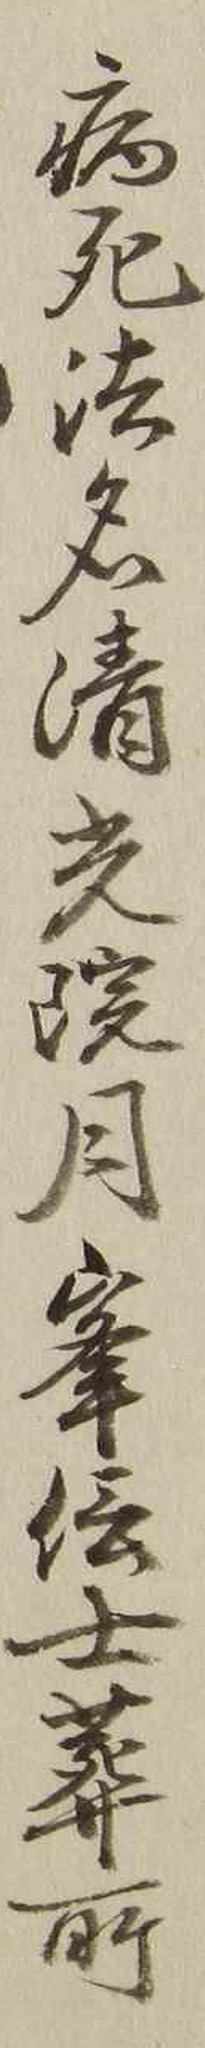病死法名清光院月峯信士葬所
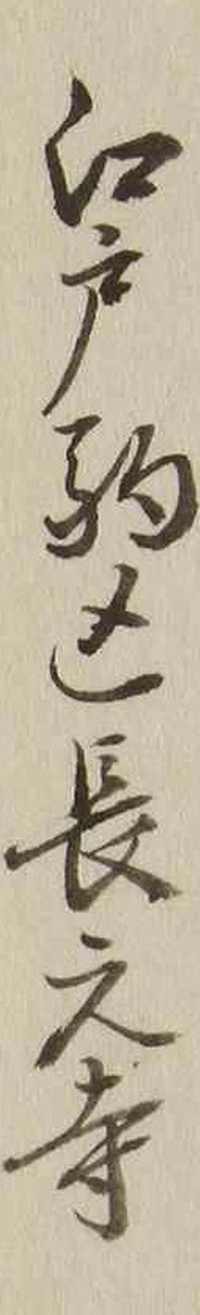江戸駒込長元寺
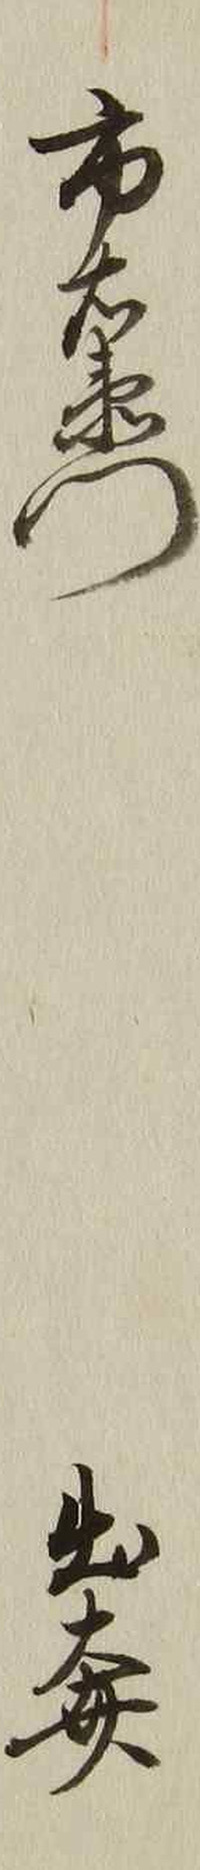市右衛門出奔
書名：諸士系譜　巻之31　い之部31
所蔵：会津若松市立会津図書館
